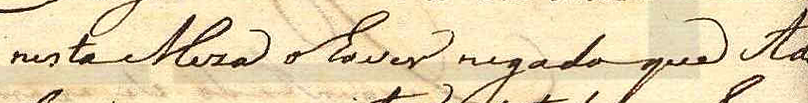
nesta Meza o haver negado que Ad
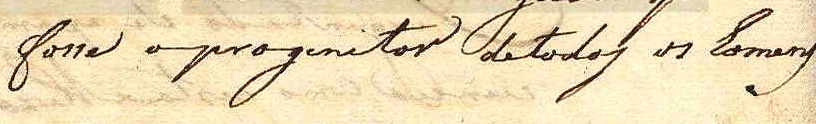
fosse o progenitor de todos os homens
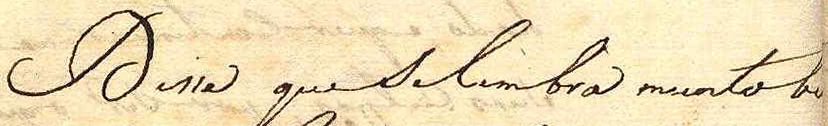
Disse que Se lembra munto b
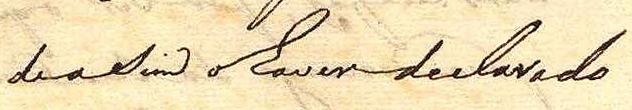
de aSim o haver declarado.
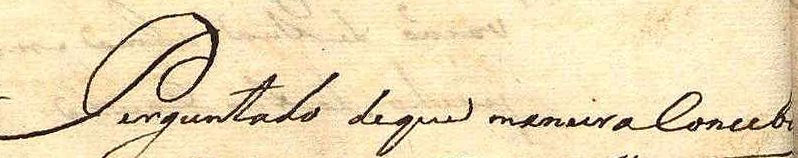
Perguntado de que maneira Conceb
